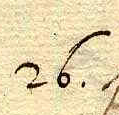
26.
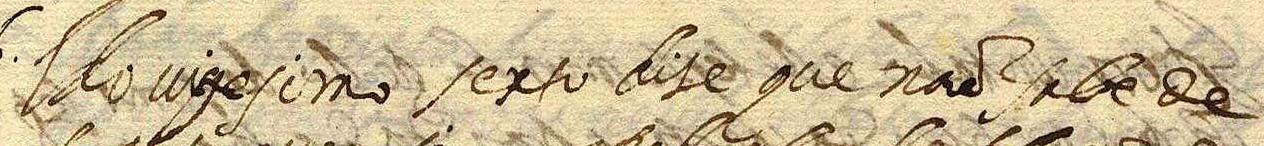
E do uigesimo sexto dise que naõ sabe de
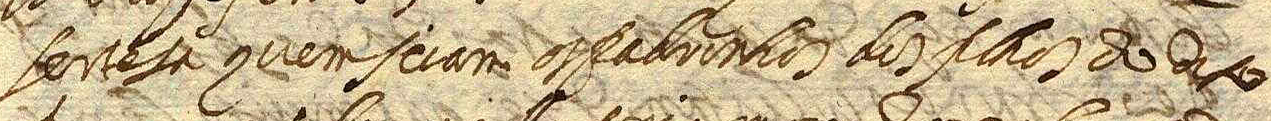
serteza quem seiam os padrinhos dos filhos do dito
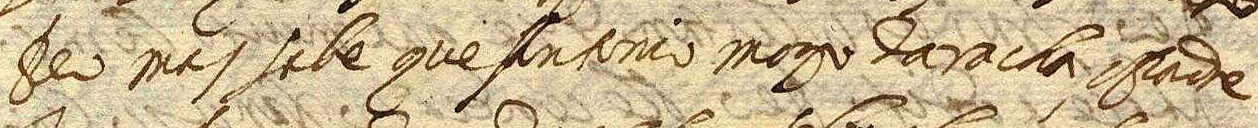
Reo mas sabe que Antonio mogo da rocha, o padre
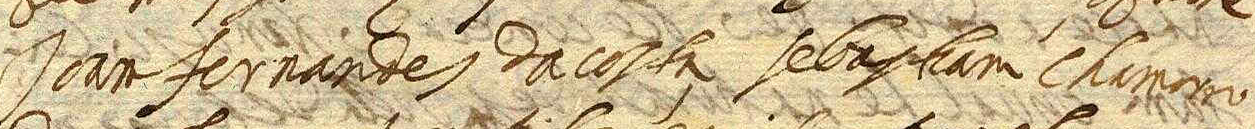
Joam fernandes da costa, sebastiam chamorro
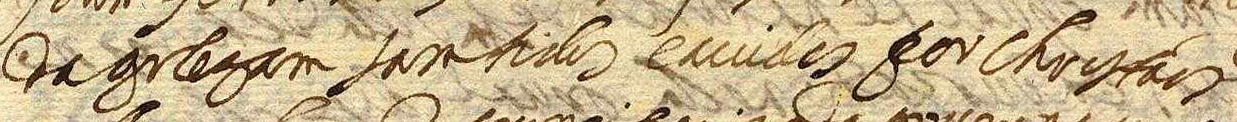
da golegam sam tidos e auidos por christaõs
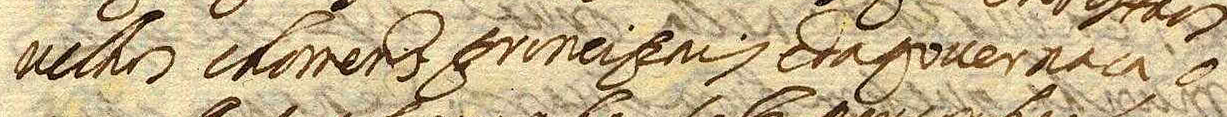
uelhos e homens principais e da gouernaça, o
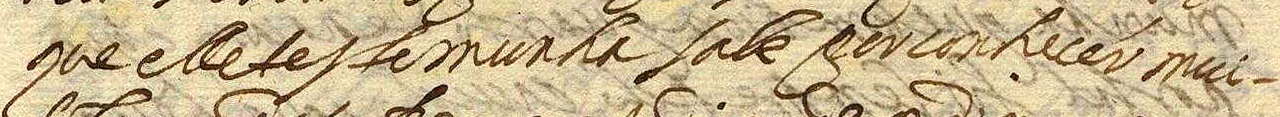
que elle testemunha sabe por conhecer mui
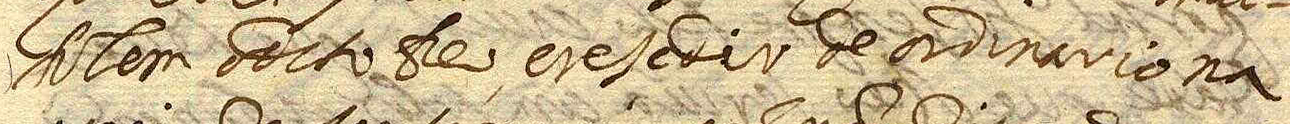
to bem o dito Reo, e resedir de ordinario na
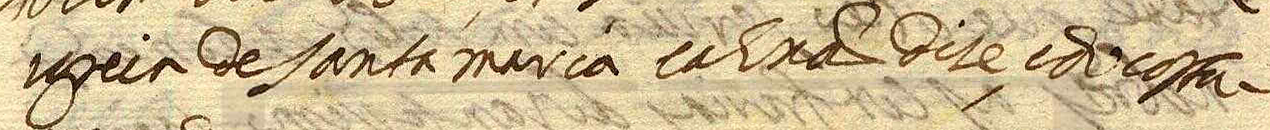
igreia de santa maria e al nā dise, e do costu
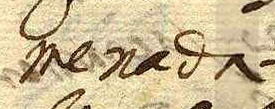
me nada
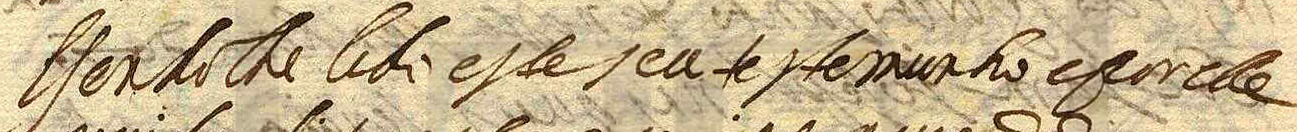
E sendolhe lido este seu testemunho e por elle
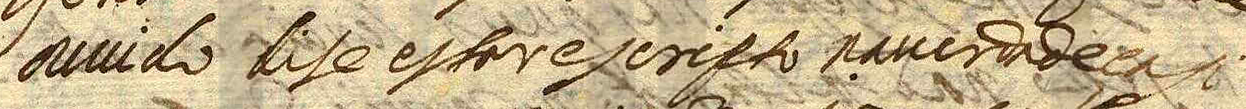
ouuido dise estar escripto na uerdade, e asi
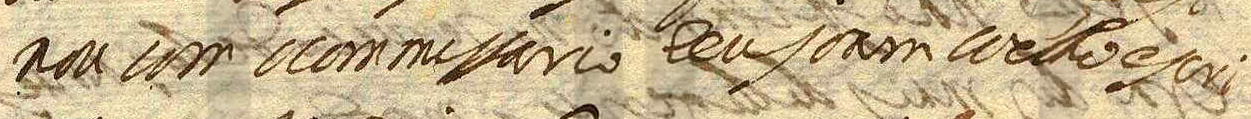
nou com o commissario e eu joam coelho escri
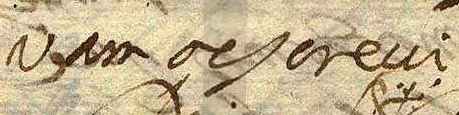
vam o escreui
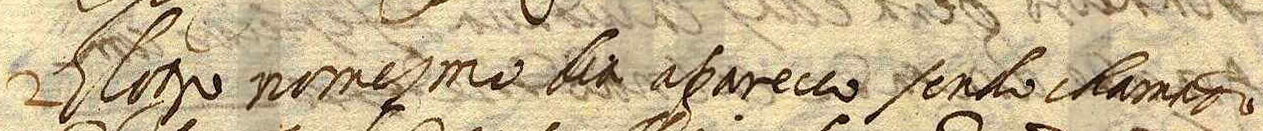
E logo no mesmo dia apareceo sendo chamado
